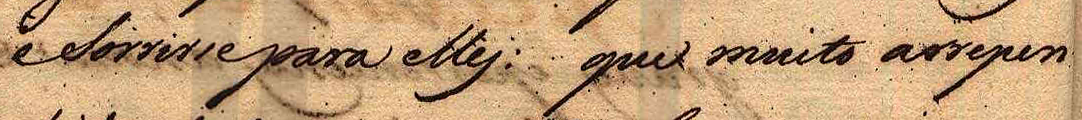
e sorrirse para elles: que muito arrepen
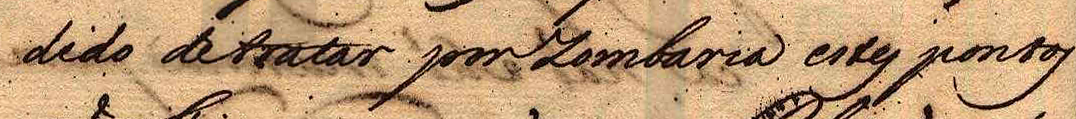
dido de tratar por Zombaria estes pontos
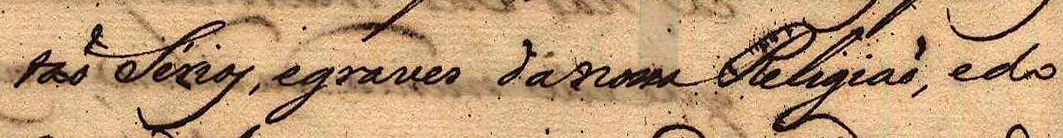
taõ Serios, e graves da nossa Religiaõ, e do
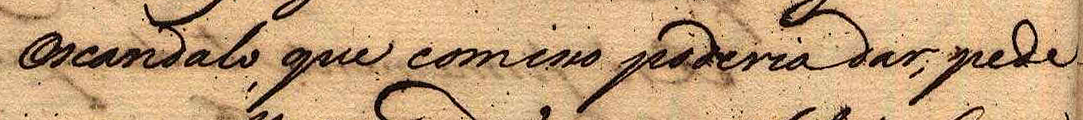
escandalo, que com isso poderia dar; pede
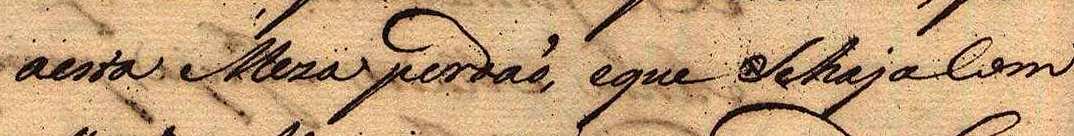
a esta Meza perdaõ, e que se haja com
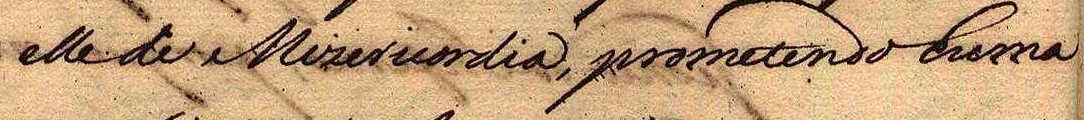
elle de Mizericordia, prometendo huma
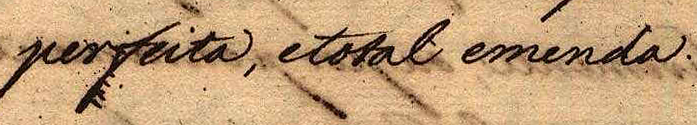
perfeita, e total emenda.
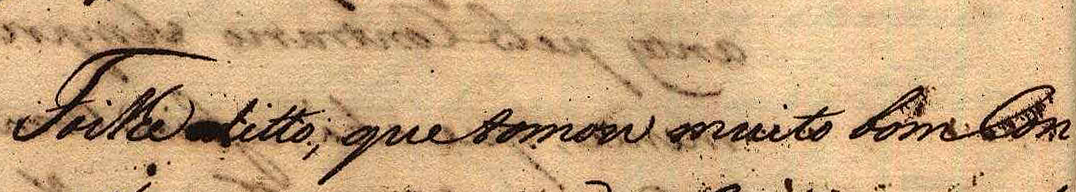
Foilhe ditto, que tomou muito bom Con
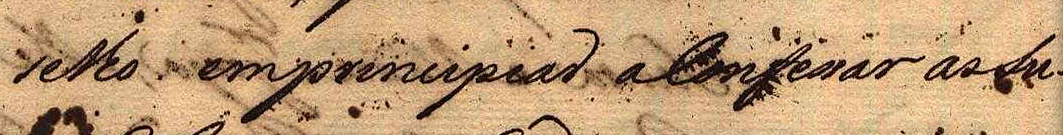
selho em principiar a Confessar as su
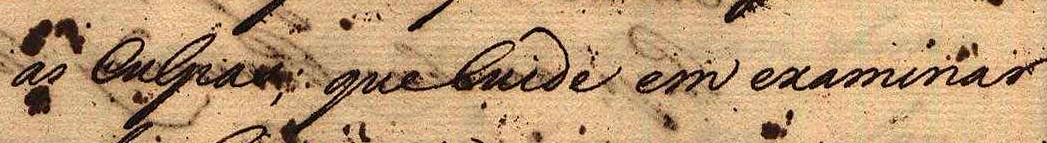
as Culpas; que Cuide em examinar
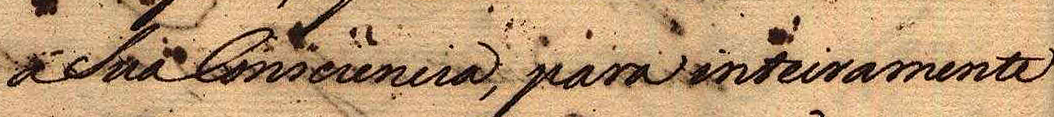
a Sua Consciencia, para inteiramente
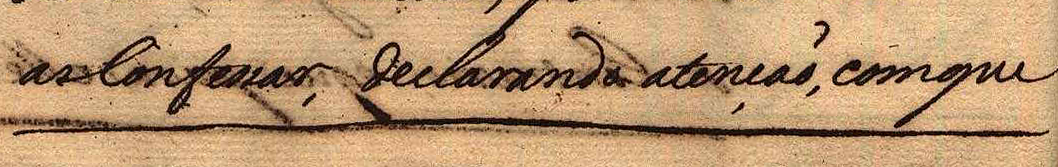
as Confessar, declarando a tençaõ, com que
